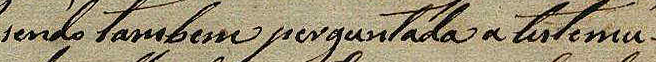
sendo tambem perguntada a testemu
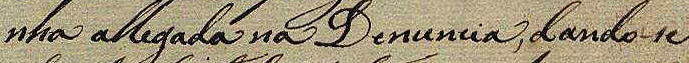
nha allegada na Denuncia, dando-se
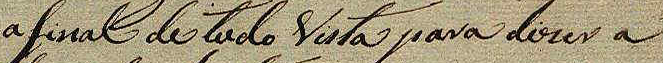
afinal de tudo Vista para dizer a
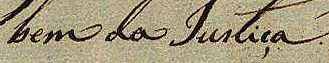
bem da Iustiça.
